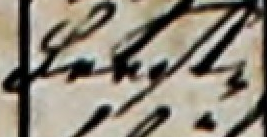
Forst„
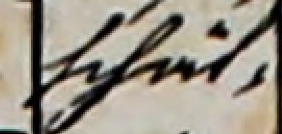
schät„
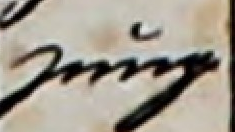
zung
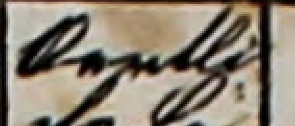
Oertli„
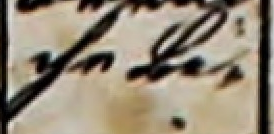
che Be„
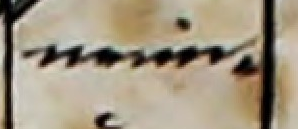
nenn„
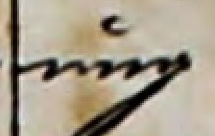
ung
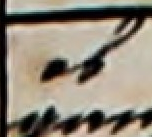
ob
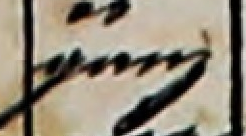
ganz
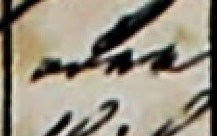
oder
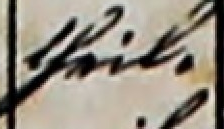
theil„
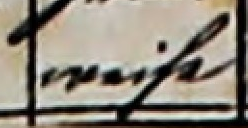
weise
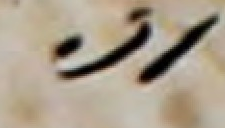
31
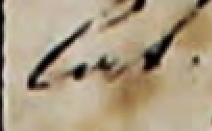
Cat.
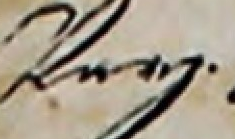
Parz.
